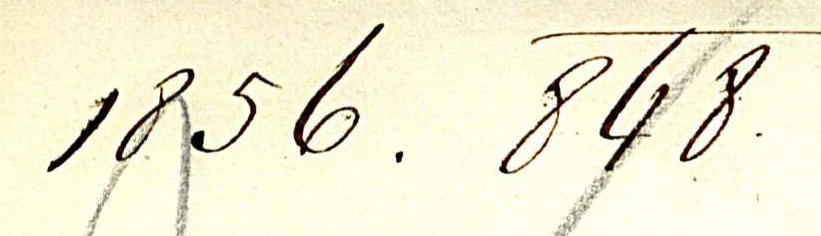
1856. 1848
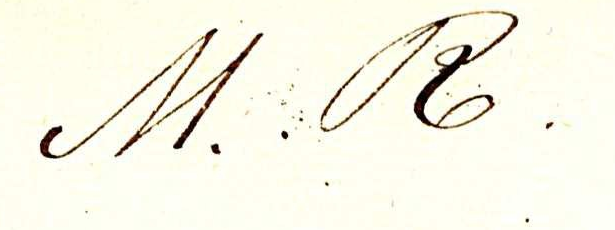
MR
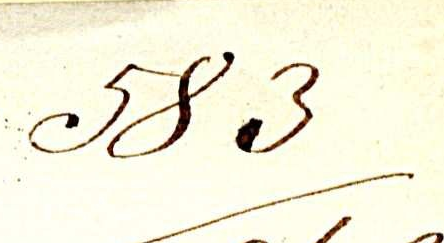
583
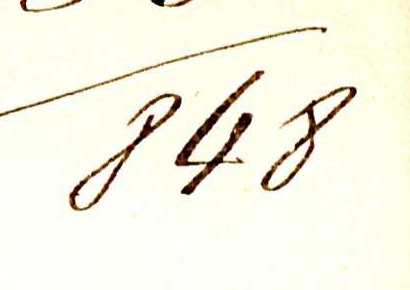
/848
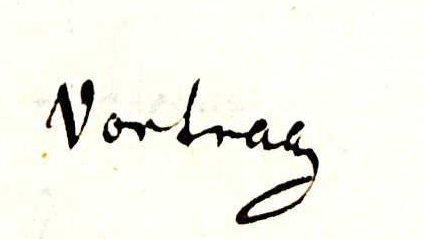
Vortrag
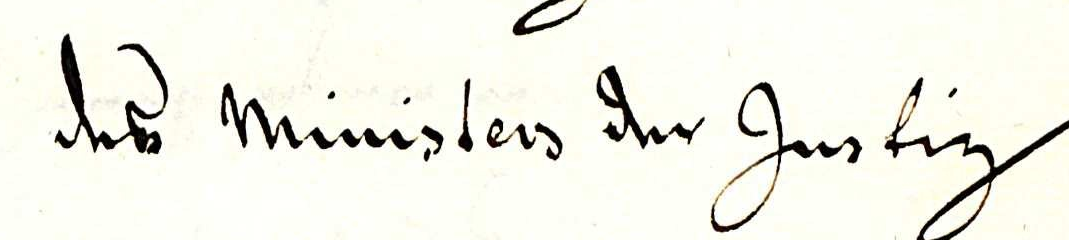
des Ministers der Justiz
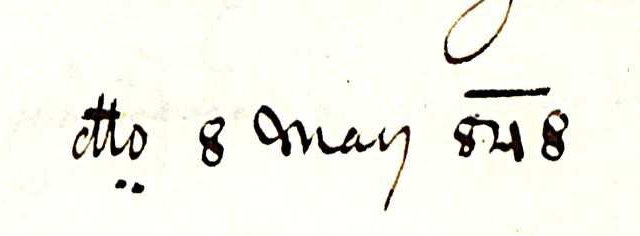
dto 8 May 1848
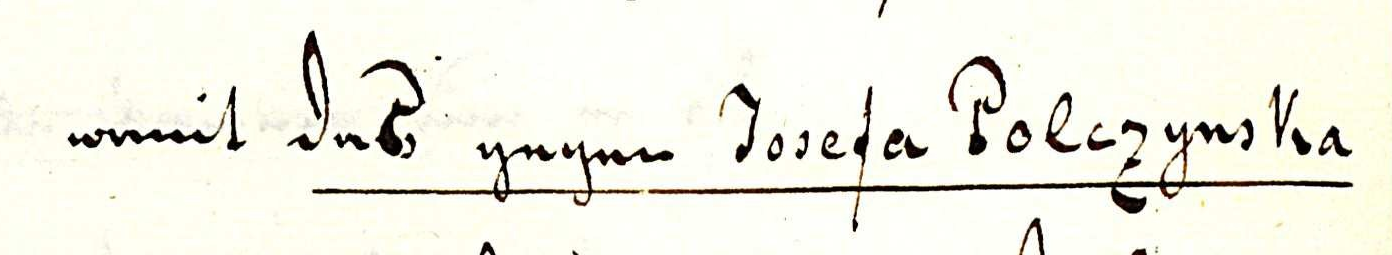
womit das gegen Josefa Polczynska
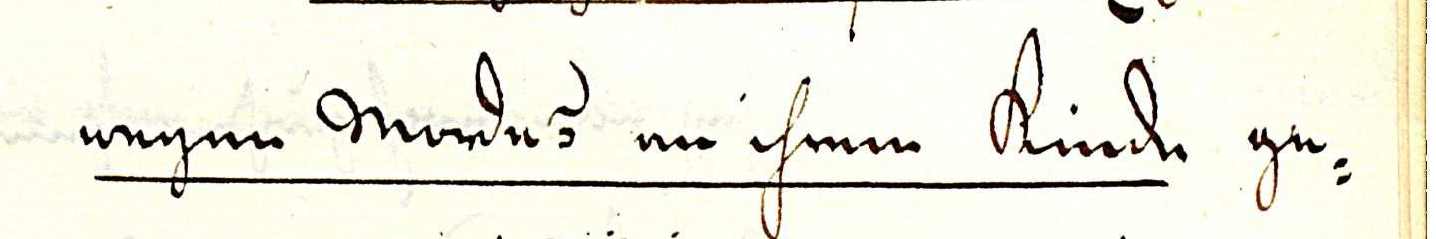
wegen Mordes an ihren Kinde ge¬
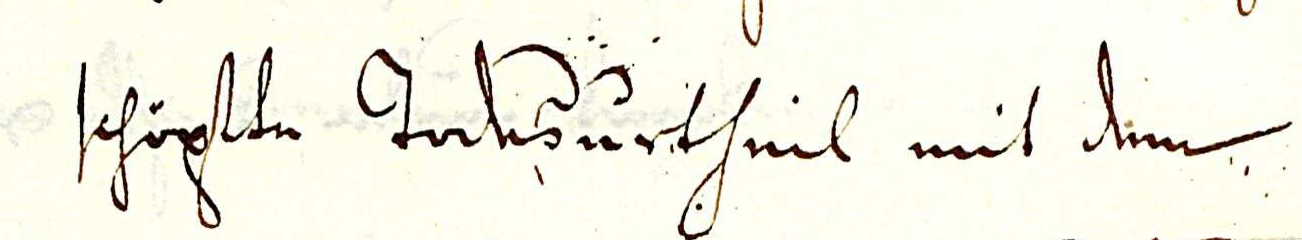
schöpfte Todesurtheil mit dem
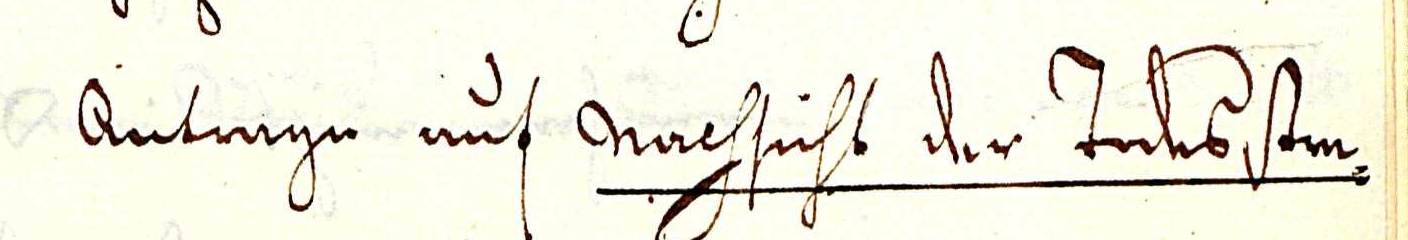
Antrage auf Nachsicht der Todesstra¬
